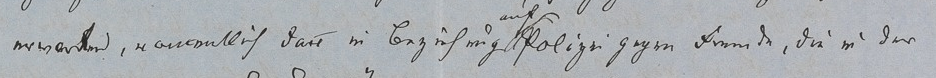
erwarten, namentlich dann in Beziehung auf Polizei gegen Fremde, die in der
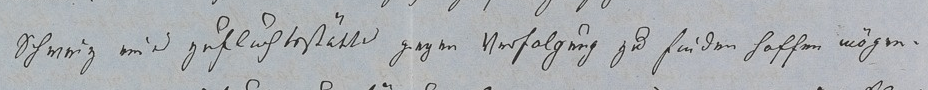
Schweiz eine Zufluchtsstätte gegen Verfolgung zu finden hoffen mögen.
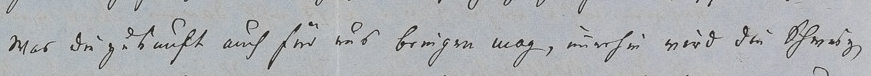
Was die Zukunft auch für uns bringen mag, immerhin wird die Schweiz,
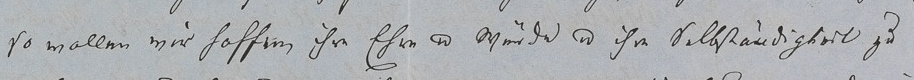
so wollen wir hoffen, ihre Ehre & Würde & ihre Selbstständigkeit zu
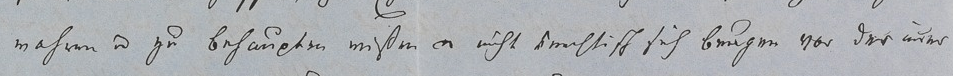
wahren & zu behaupten wissen & nicht knechtisch sich beugen vor der immer
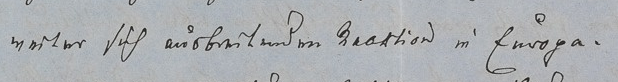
weiter sich ausbreitenden Reaktion in Europa.
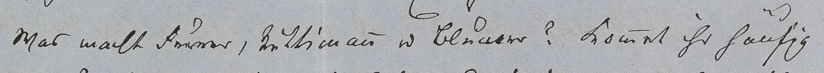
Was macht Furrer, Rüttimann &Blumer? Kommet ihr häufig
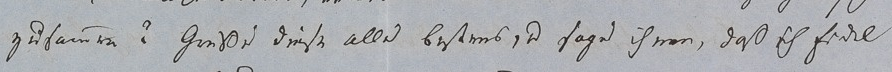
zusammen? Grüße sie alle bestens, & sage ihnen, daß ich fidel
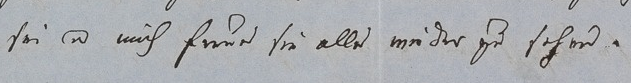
sei & mich freue sie alle wieder zu sehen.
